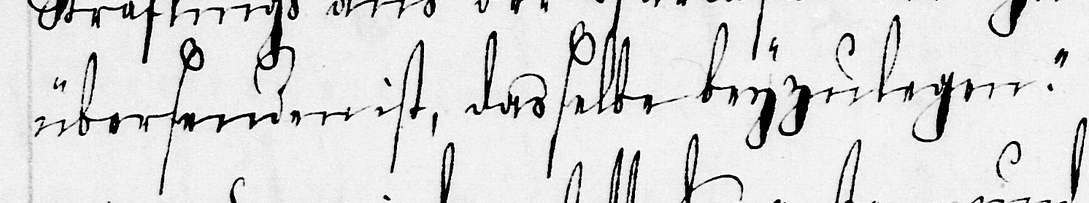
übersenden ist, dasselbe beyzulegen.“
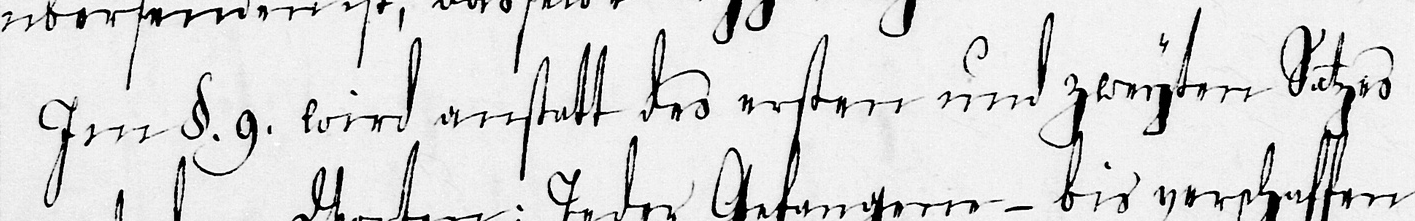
Im §. 9. wird anstatt des ersten und zweyten Satzes
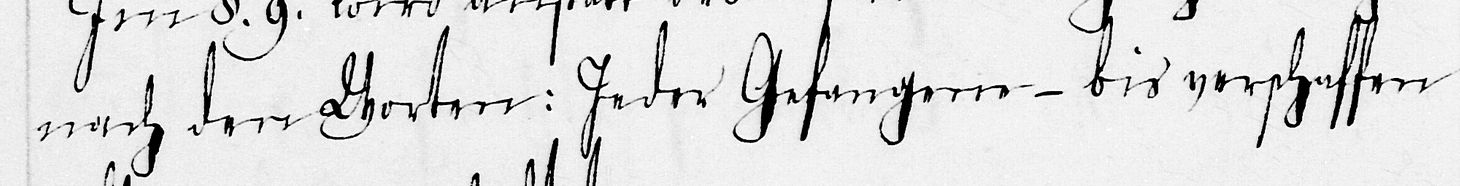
nach den Worten: Jeder Gefangene – bis verschaffen
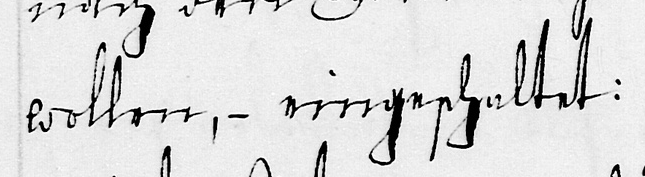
wollen, – eingeschaltet:
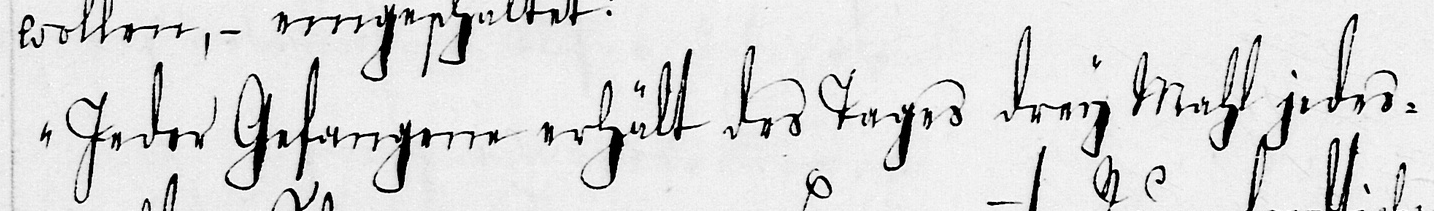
„Jeder Gefangene erhält des Tages drey Mahl jedes¬
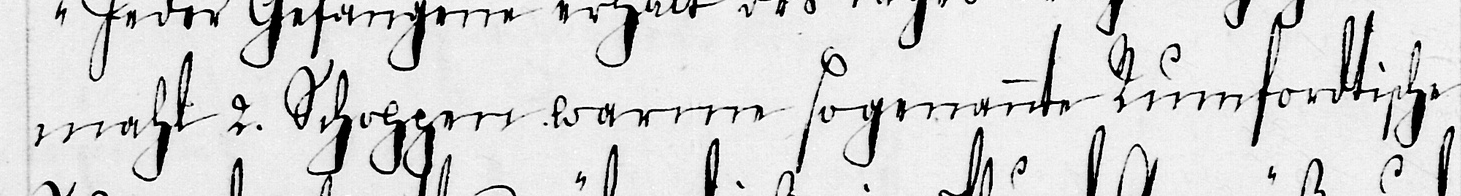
mahl 2. Schoppen warme sogenannte Rumfordtische
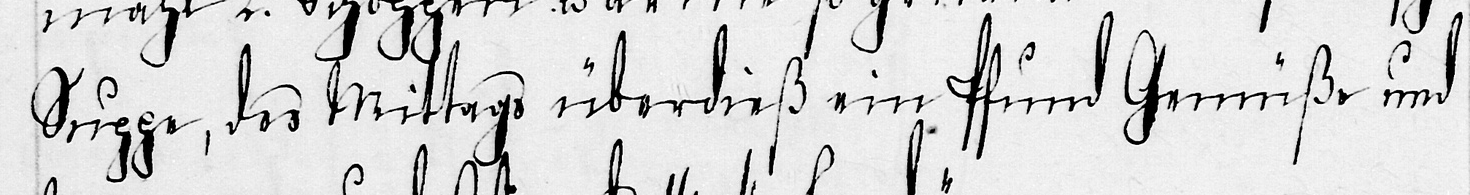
Suppe, des Mittags überdieß ein Pfund Gemüße und
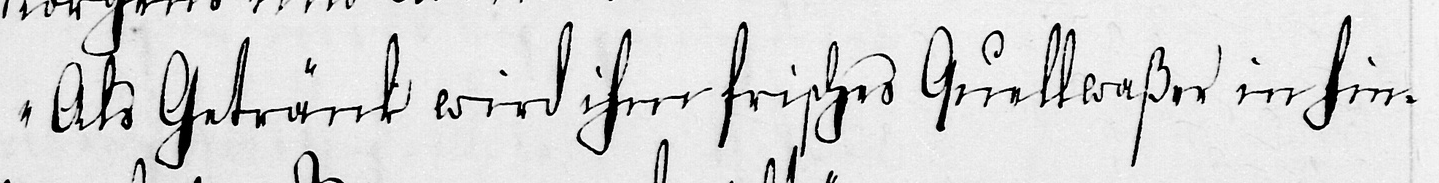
„Als Getränk wird ihm frisches Quellwaßer in hin¬
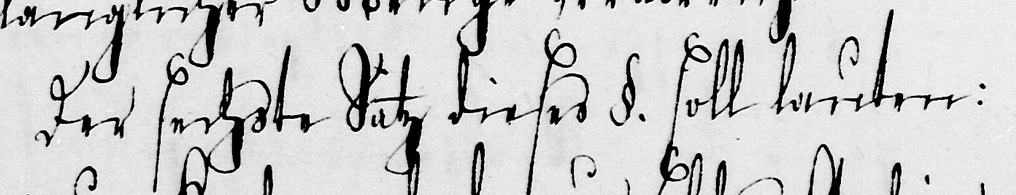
Der sechste Satz dieses §. soll lauten:
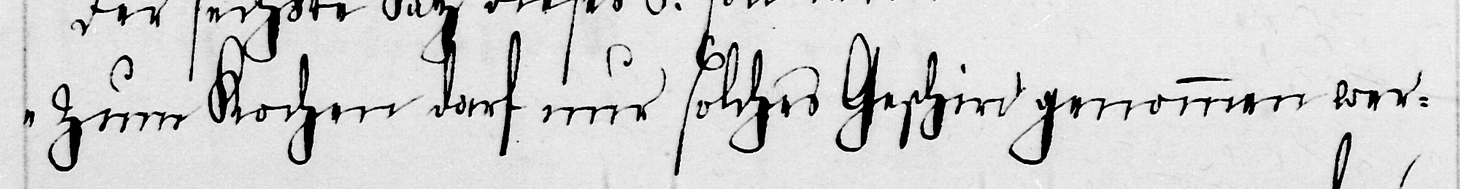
„Zum Kochen darf nur solches Geschirr genommen wer-
